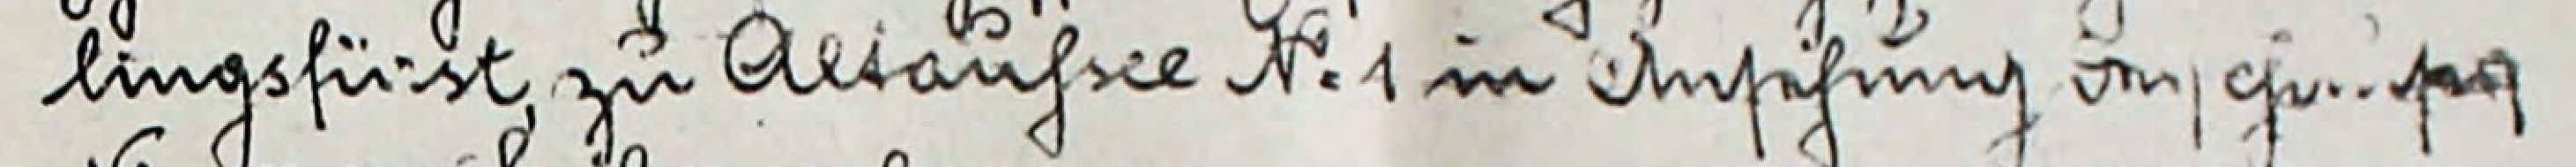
lingsfürst, zu Altaussee No 1 in Ansehung des Hauses
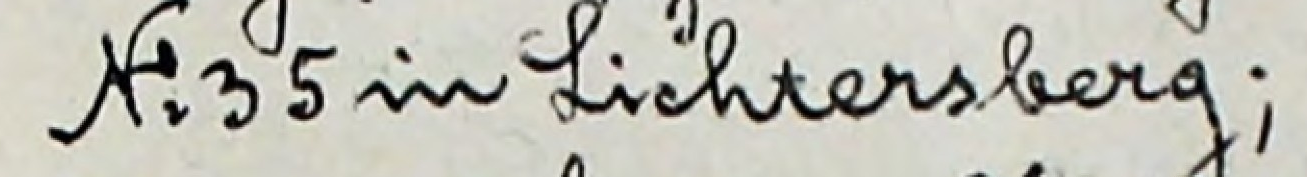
No 35 in Lichtersberg;
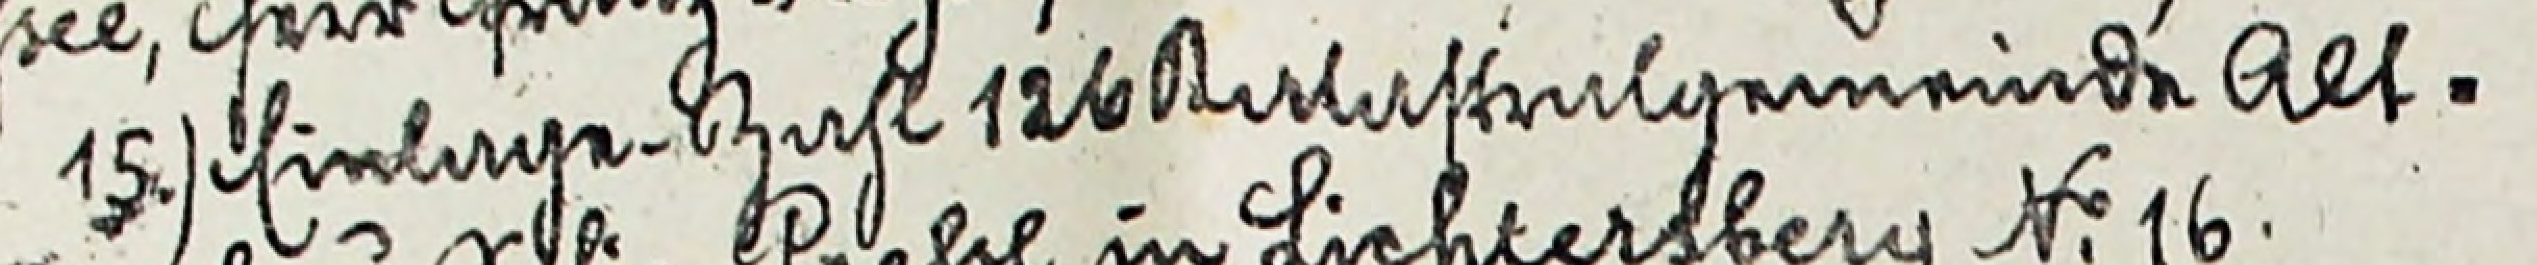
15.) Einlage - Zahl 126 Katastralgemeinde Alt=
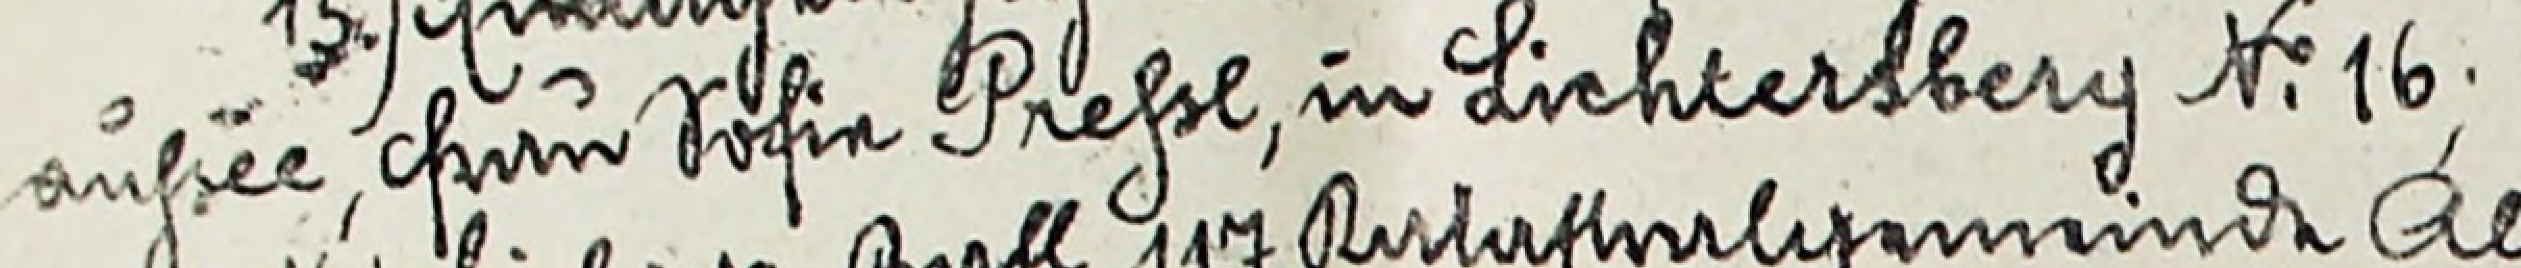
aussee, Frau Sofie Pressl, in Lichtersberg No 16;
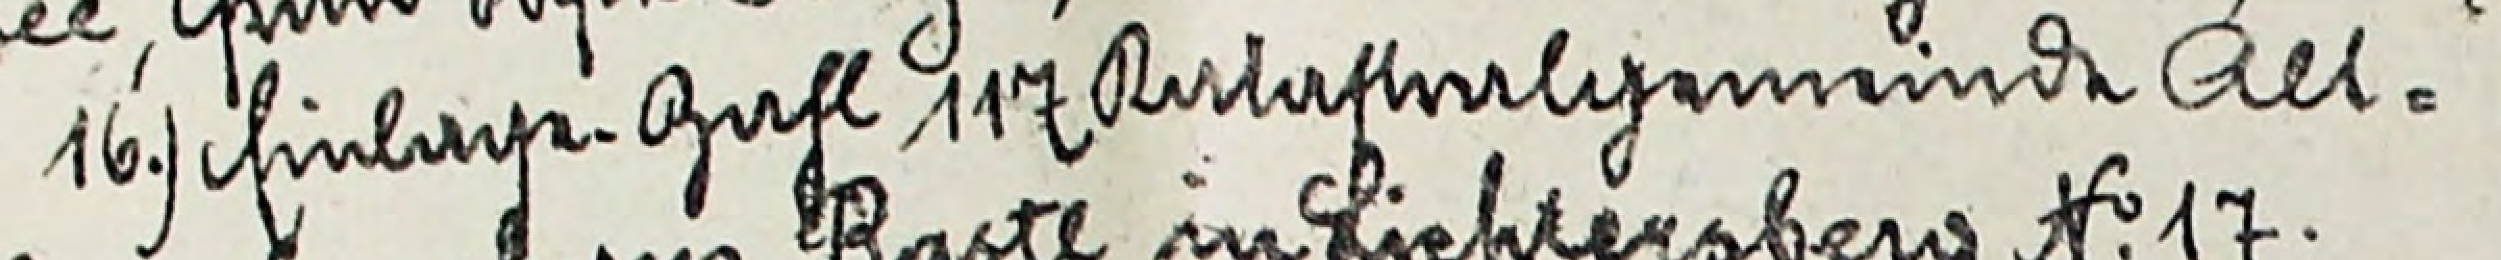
16.) Einlage - Zahl 117 Katastralgemeinde Alt=
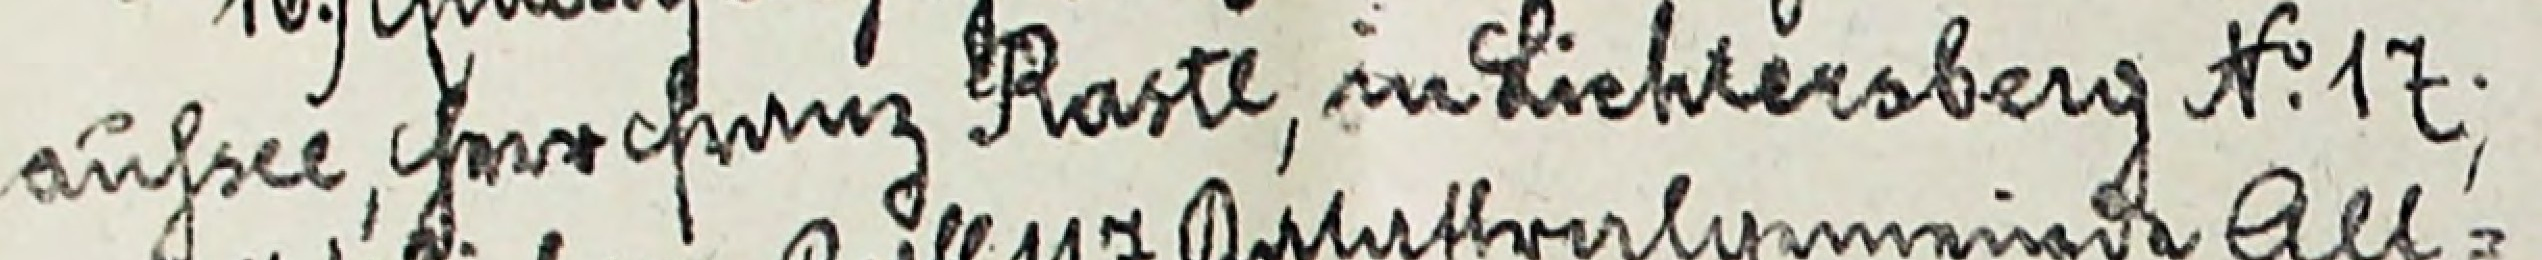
aussee, Herr Franz Rastl, in Lichtersberg No 17;
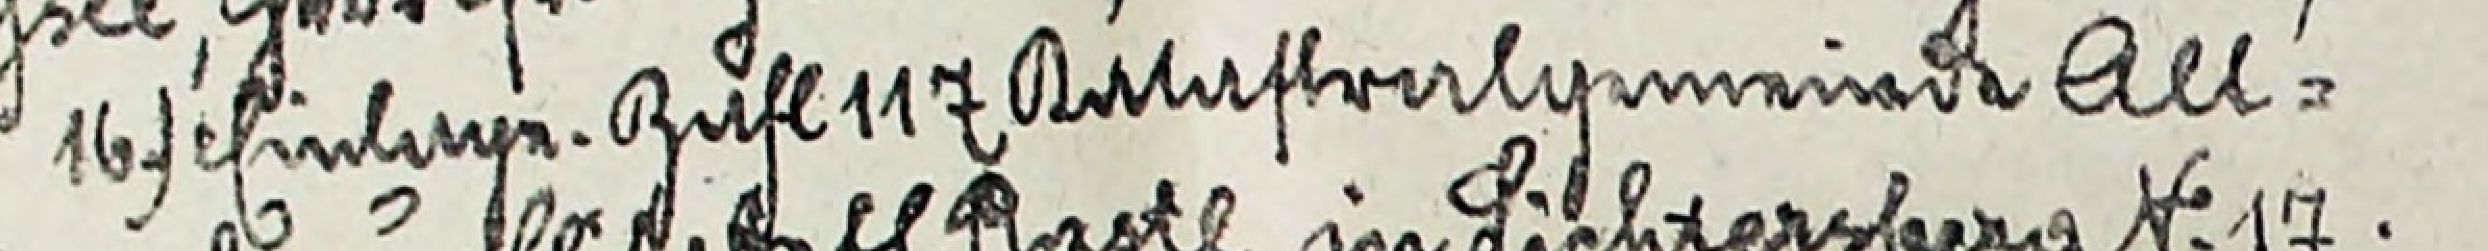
16.) Einlage - Zahl 117 Katastralgemeinde Alt=
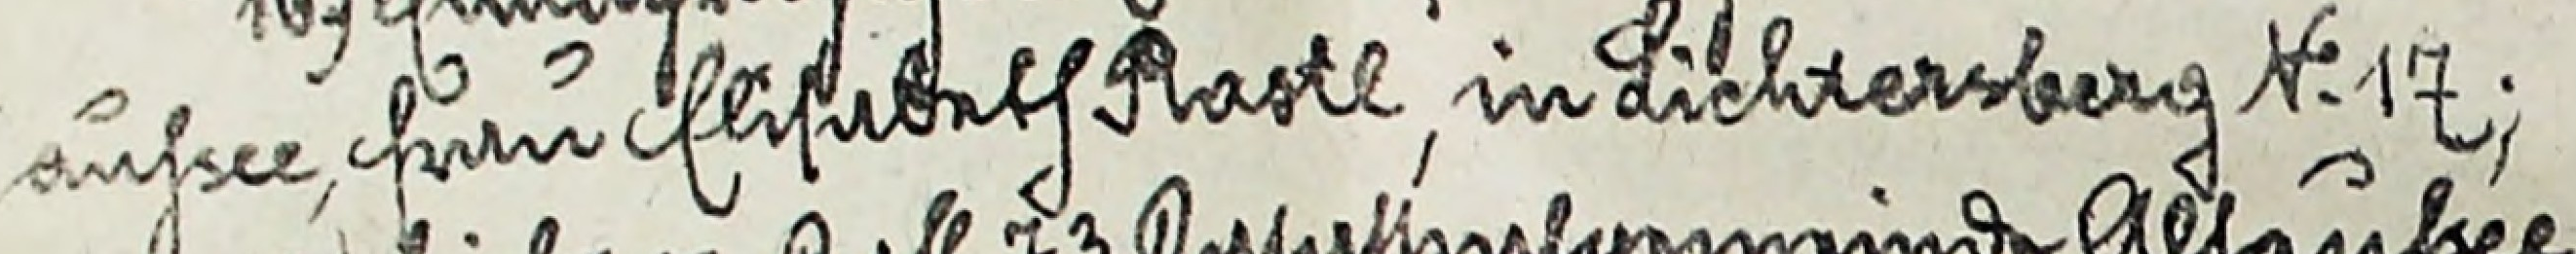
aussee, Frau Elisabeth Rastl, in Lichtersberg No 17;
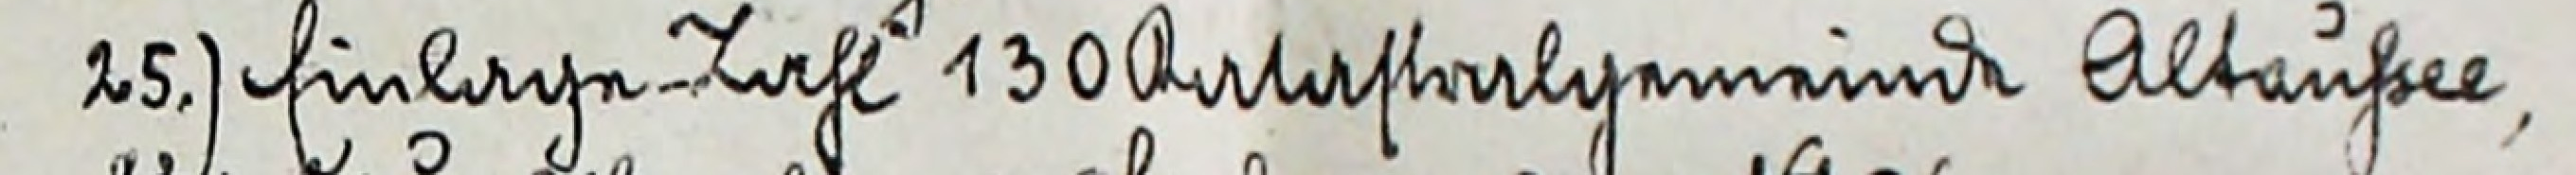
25.) Einlage - Zahl 130 Katastralgemeinde Altaussee,
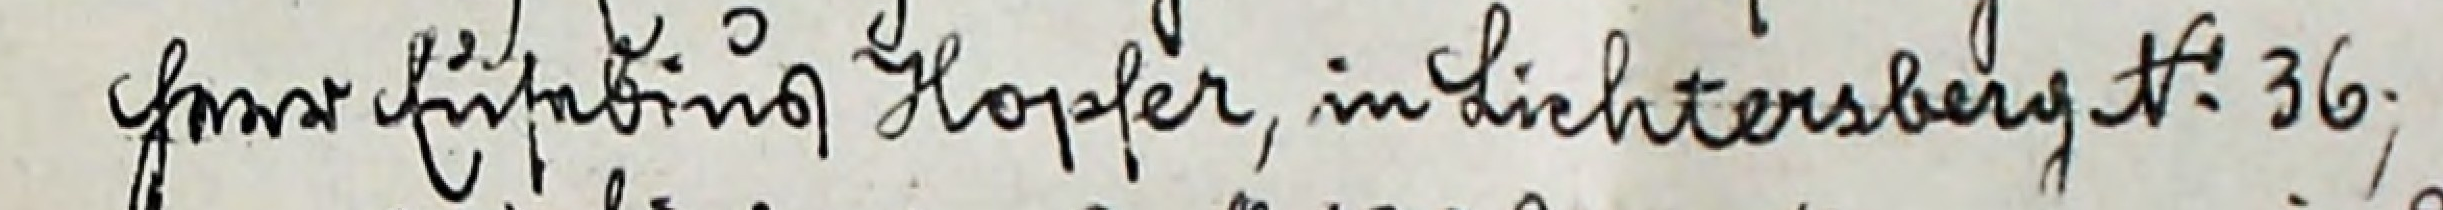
Herr Eusebius Hopfer, in Lichtersberg No 36;
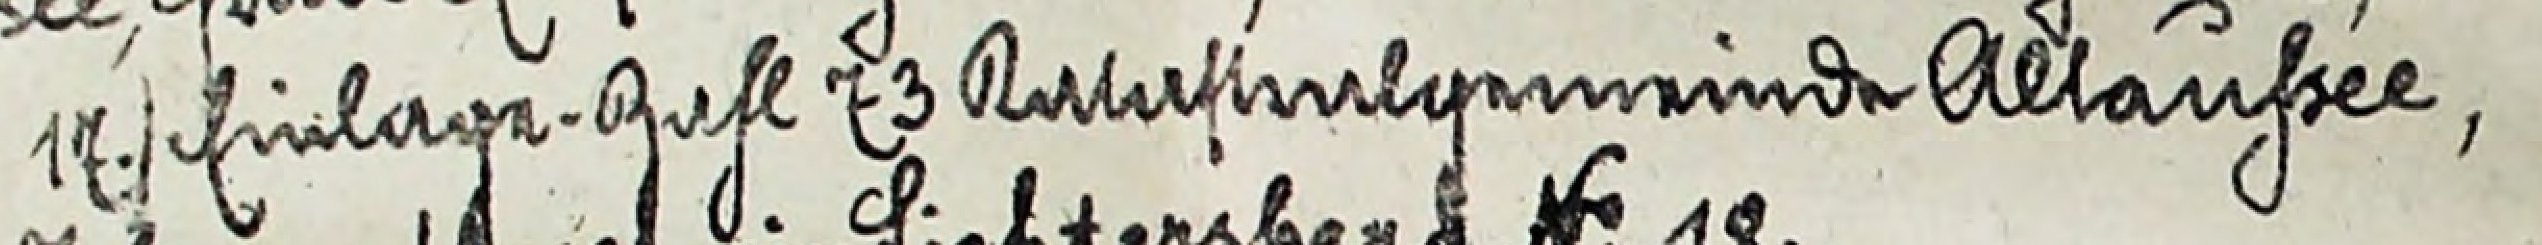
17.) Einlage - Zahl 73 Katastralgemeinde Altaussee,
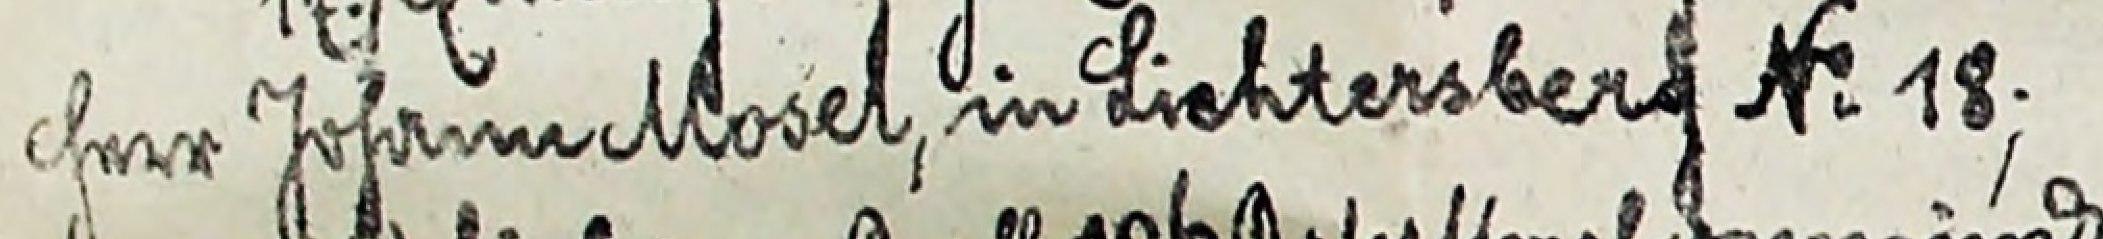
Herr Johann Moser, in Lichtersberg No 18;
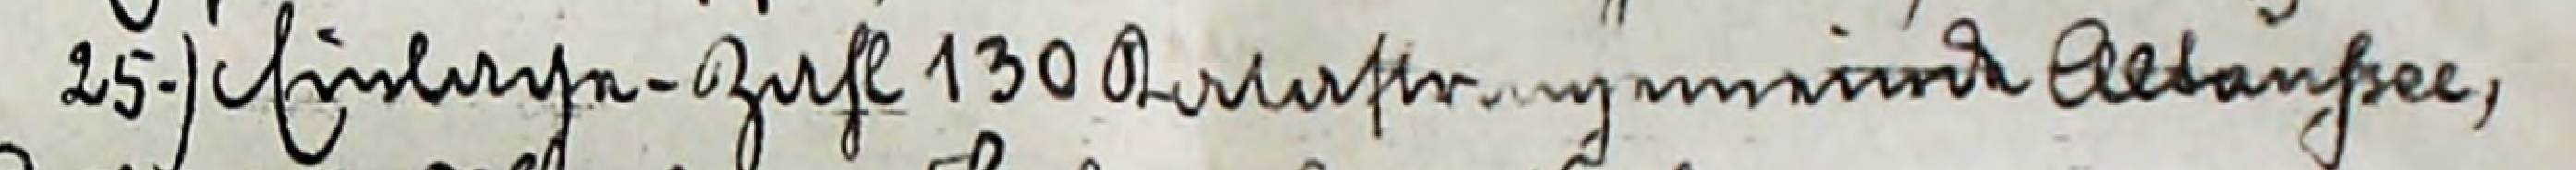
25.) Einlage - Zahl 130 Katastralgemeinde Altaussee,
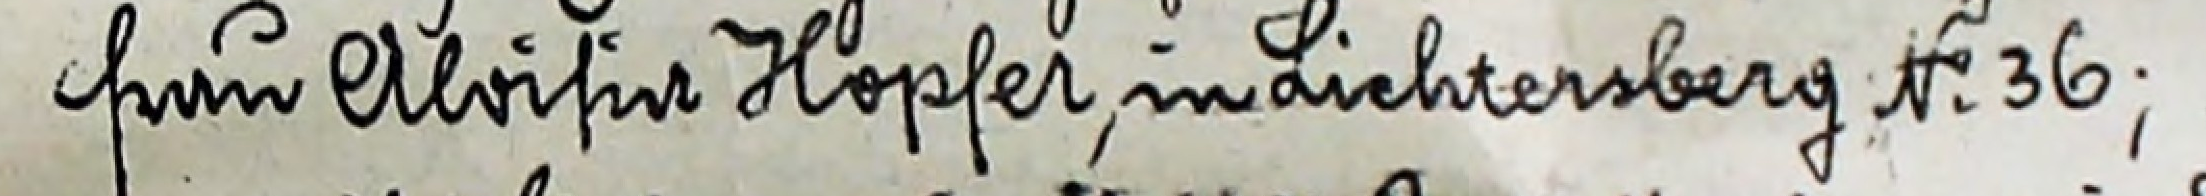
Frau Aloisia Hopfer, in Lichtersberg No 36;
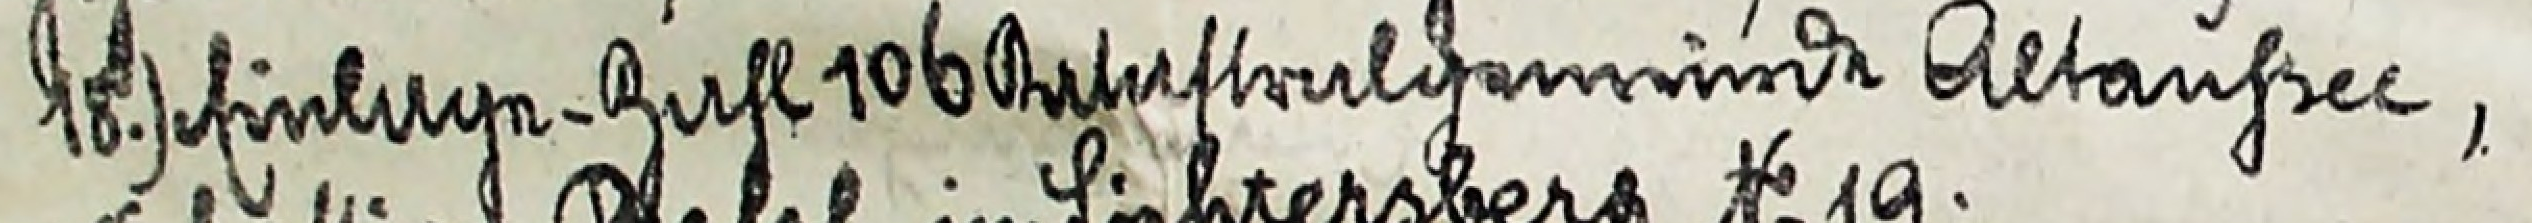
18.) Einlage - Zahl 106 Katastralgemeinde Altaussee,
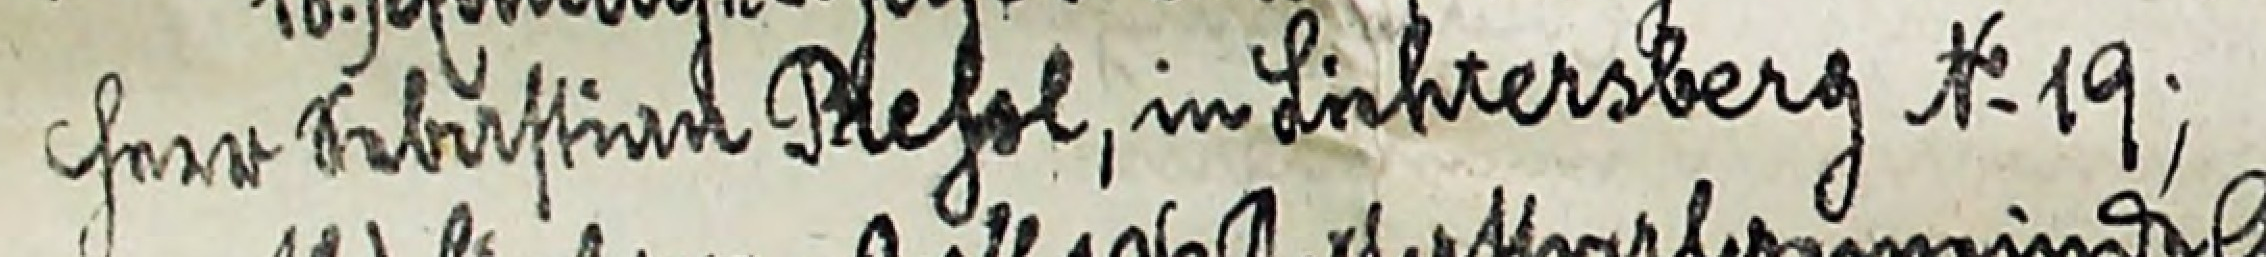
Herr Sebastian Pressl, in Lichtersberg No 19;
